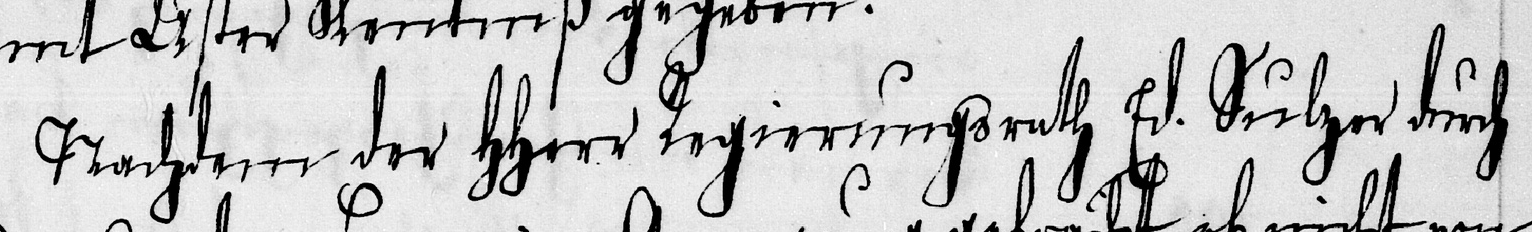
Nachdem der HHerr Regierungsrath Ed. Sulzer durch
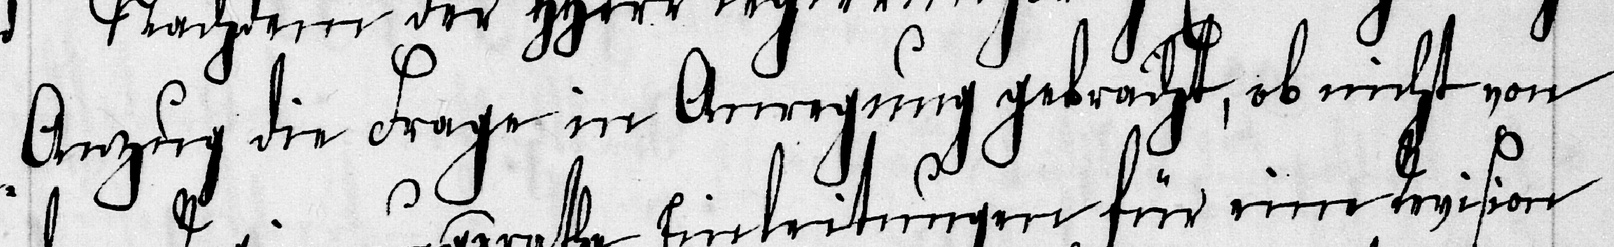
Anzug die Frage in Anregung gebracht, ob nicht von
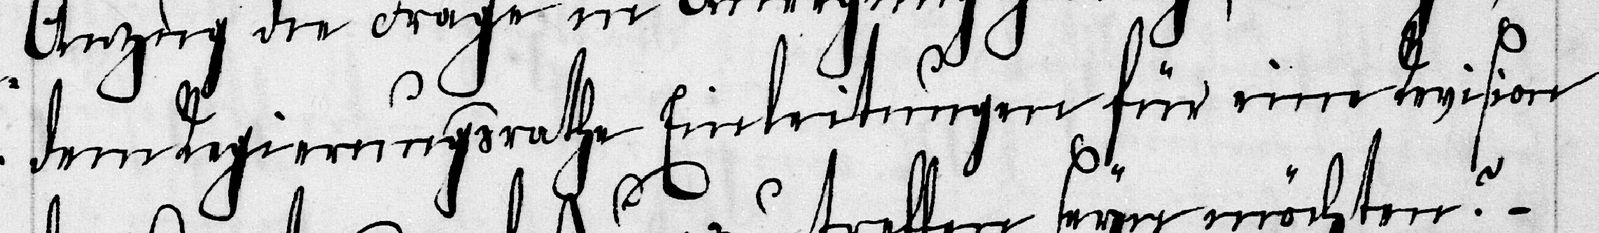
dem Regierungsrathe Einleitungen für eine Revision
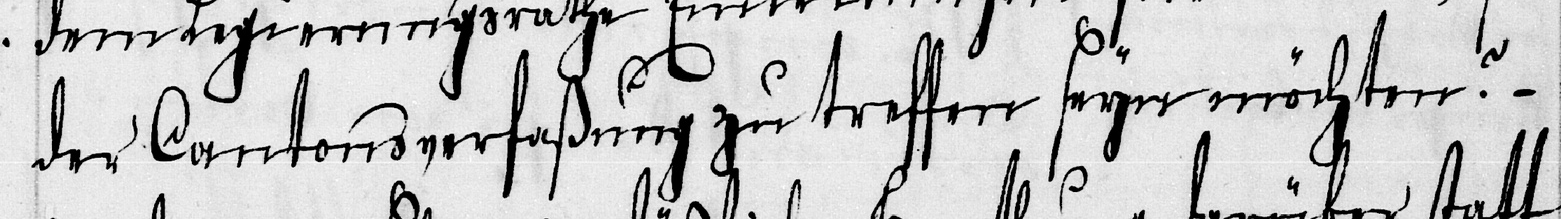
der Cantonsverfaßung zu treffen seyn möchten? –
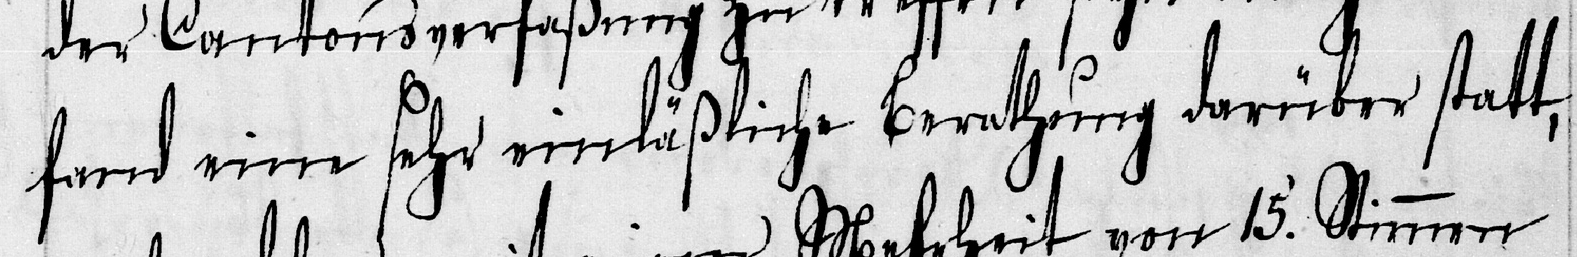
fand eine sehr einläßliche Berathung darüber statt,
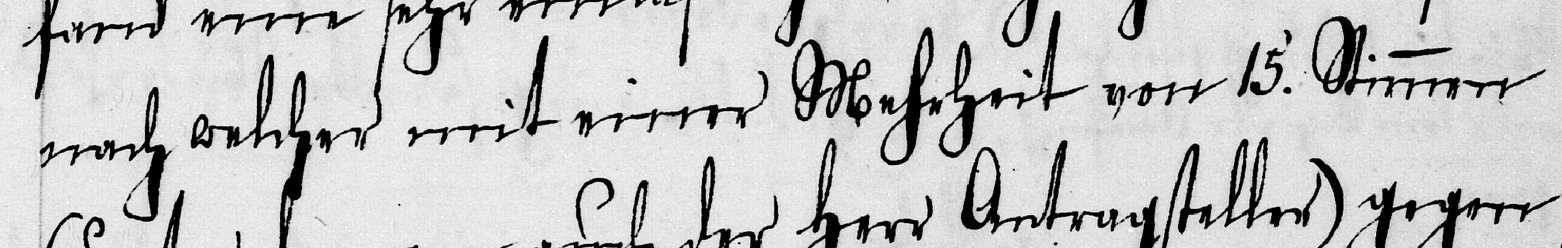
nach welcher mit einer Mehrheit von 15. Stimmen
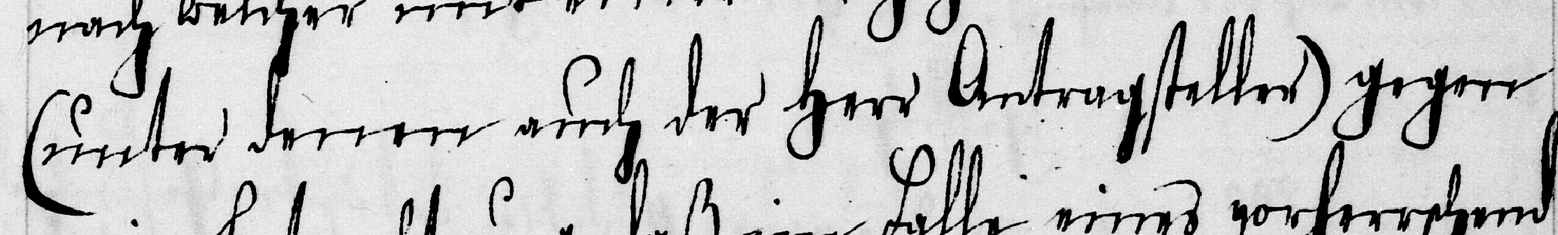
(unter denen auch der Herr Antragsteller) gegen
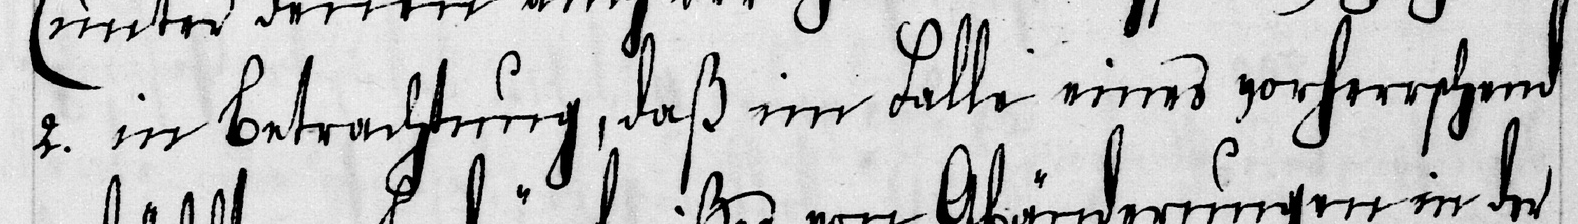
2. in Betrachtung, daß im Falle eines vorherrschend
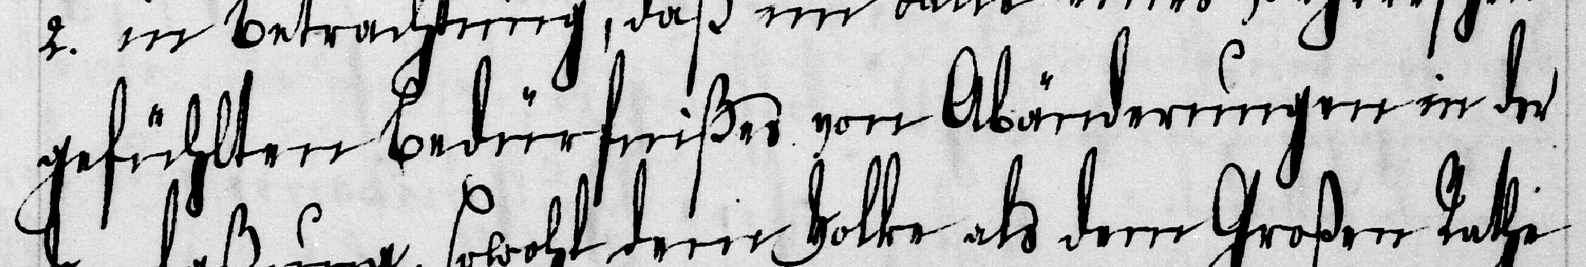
gefühlten Bedürfnißes von Abänderungen in der
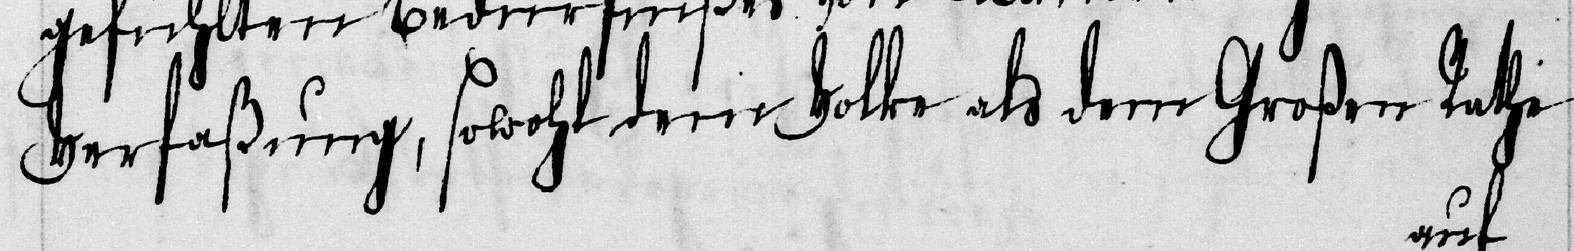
Verfaßung, sowohl dem Volke als dem Großen Rathe
